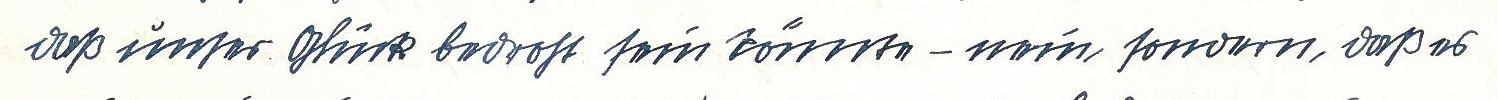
daß unser Glück bedroht sein könnte – nein, sondern, daß es
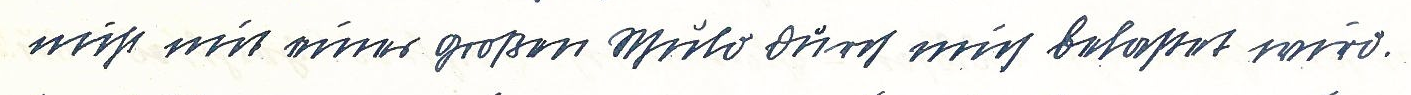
nicht mit einer großen Schuld durch mich belastet wird.
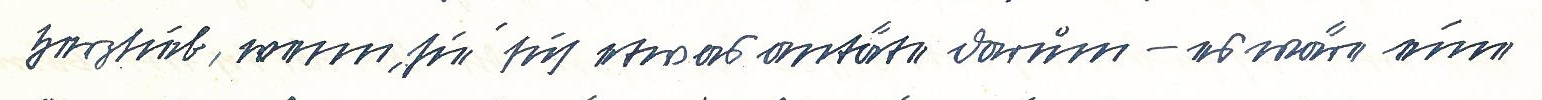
Herzlieb, wenn ‘sie’ sich etwas antäte darum – es wäre eine
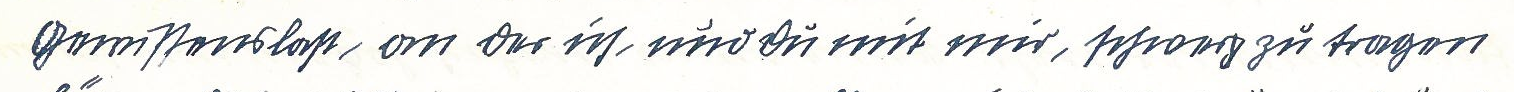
Gewissenslast, an der ich, und Du mit mir, schwer zu tragen
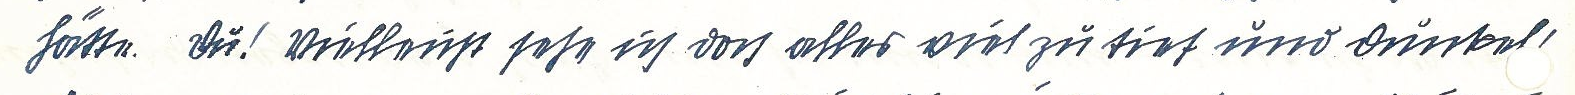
hätte. Du! Vielleicht sehe ich doch alles viel zu tief und dunkel,
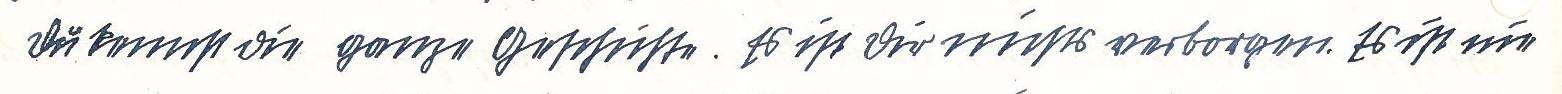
Du kennst die ganze Geschichte. Es ist Dir nichts verborgen. Es ist nie
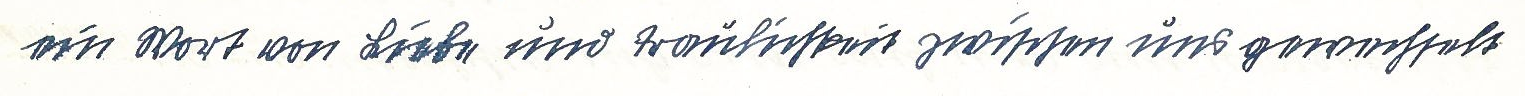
ein Wort von Liebe und Traulichkeit zwischen uns gewechselt
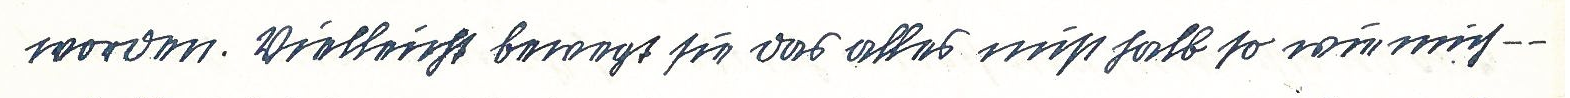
worden. Vielleicht bewegt sie das alles nicht halb so wie mich – –
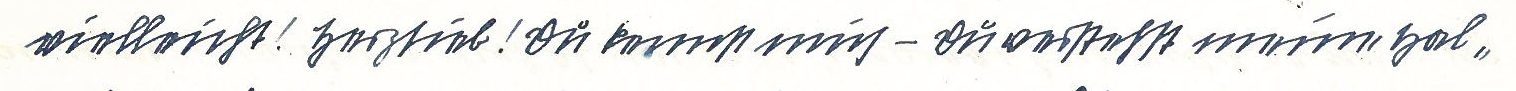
vielleicht! Herzlieb! Du kennst mich – Du verstehst meine Hal¬
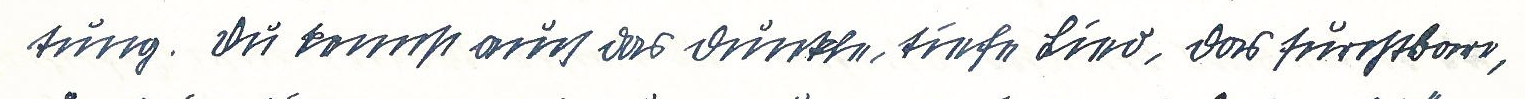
tung. Du kennst auch das dunkle, tiefe Lied, das furchtbare,
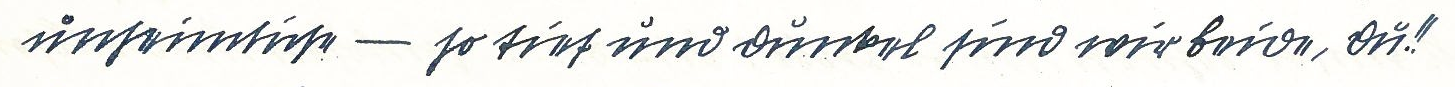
unheimliche – so tief und dunkel sind wir beide, Du!!
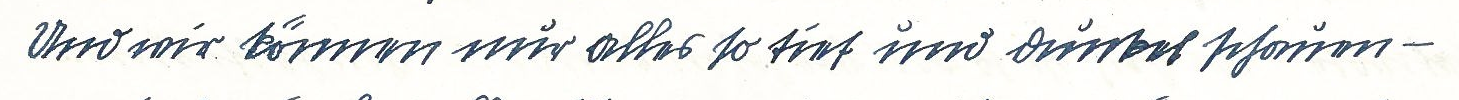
Und wir können nur alles so tief und dunkel schauen –
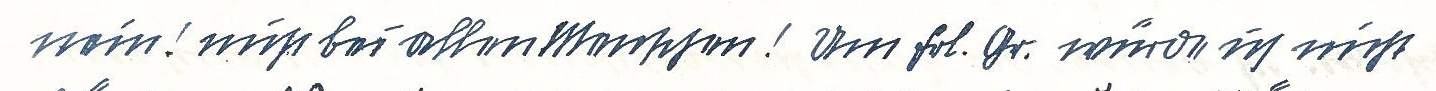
nein! nicht bei allen Menschen! Um Frl. Gr. würde ich nicht
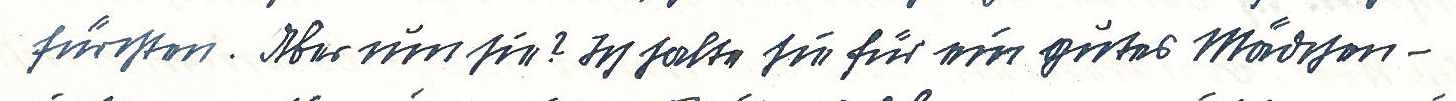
fürchten. Aber um sie? Ich halte sie für ein gutes Mädchen –
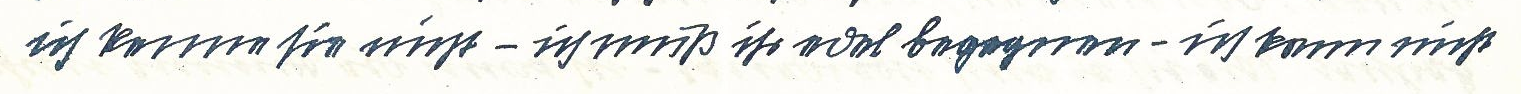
ich kenne sie nicht – ich muß ihr edel begegnen – ich kann nicht
